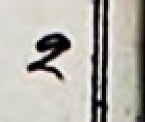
2
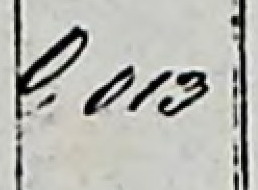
0,013
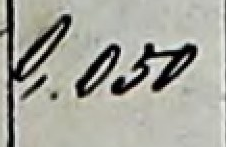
0,050
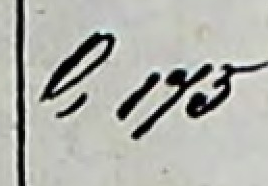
0,175
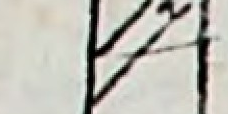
17
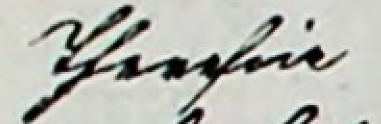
Theresia
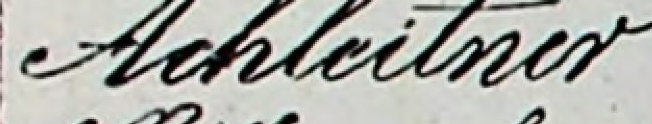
Achleitner
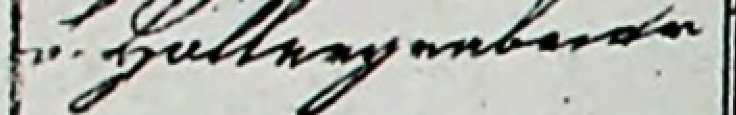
v. Hottergraben
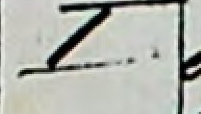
I
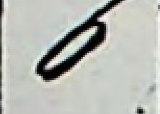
6
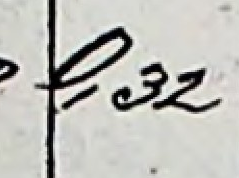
0,32
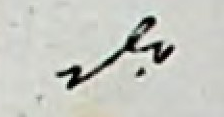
do
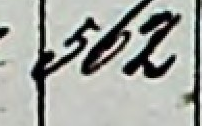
562
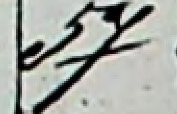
57
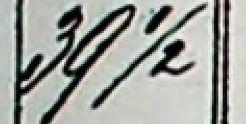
39 1/2
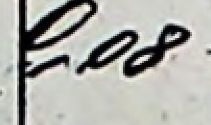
0,08
